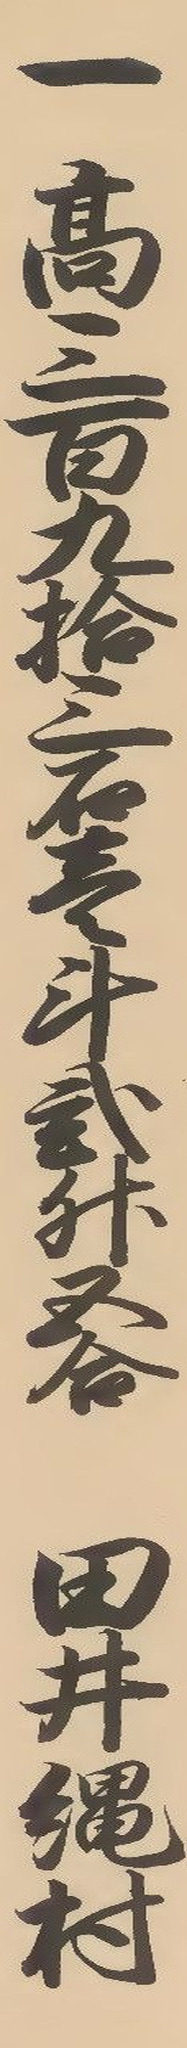一高三百九拾三石壱斗弐升五合田井縄村
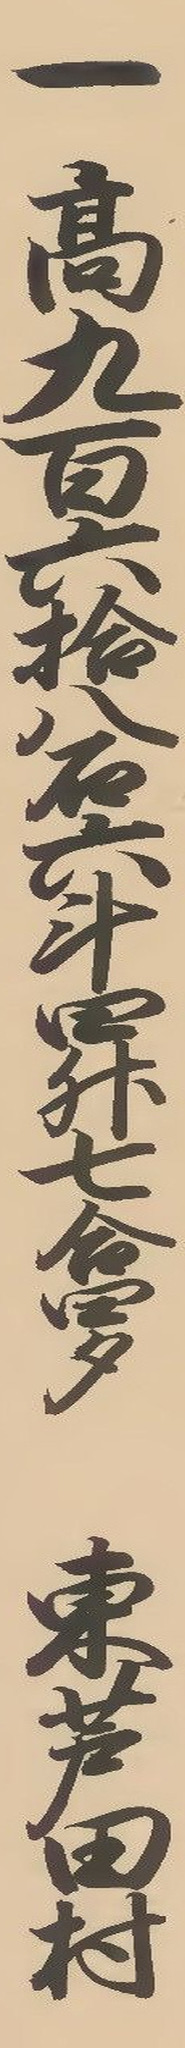一高九百六拾八石六斗四升七合四勺東芦田村
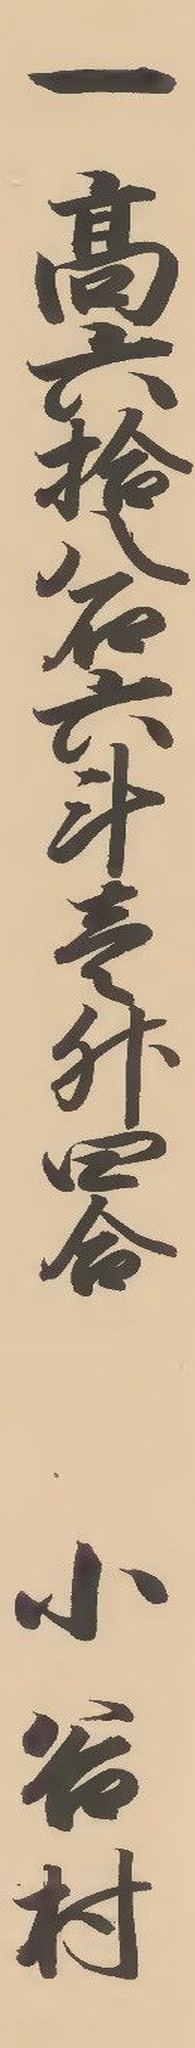一高六拾八石六斗壱升四合小谷村
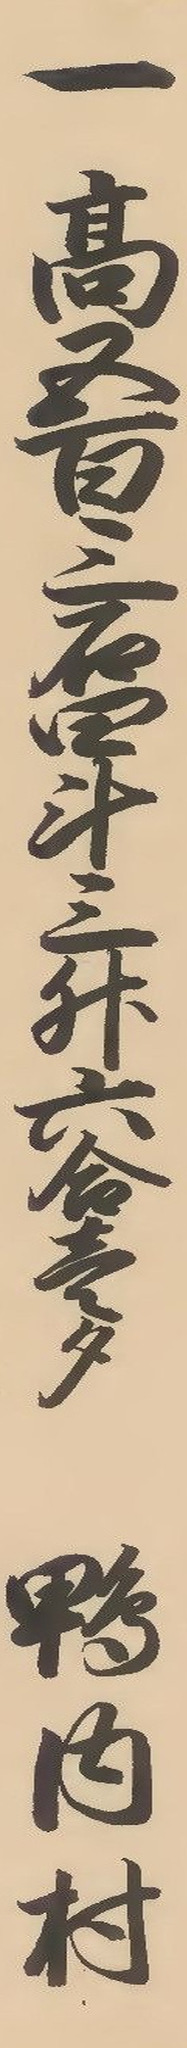一高五百三石四斗三升六合壱勺鴨内村
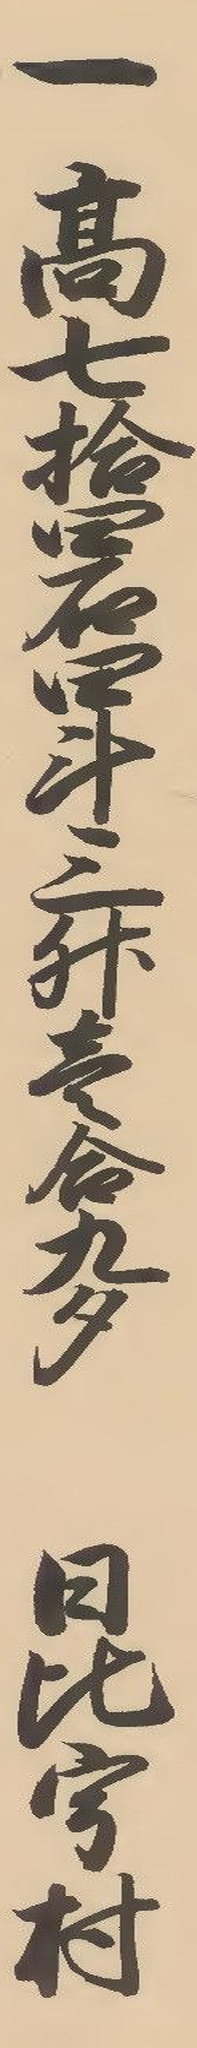一高七拾四石四斗三升壱合九勺日比宇村
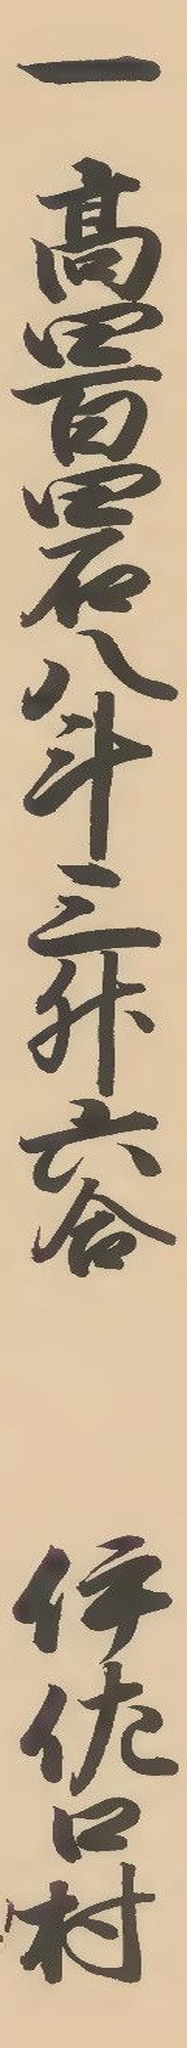一高四百四石八斗三升六合伊佐口村

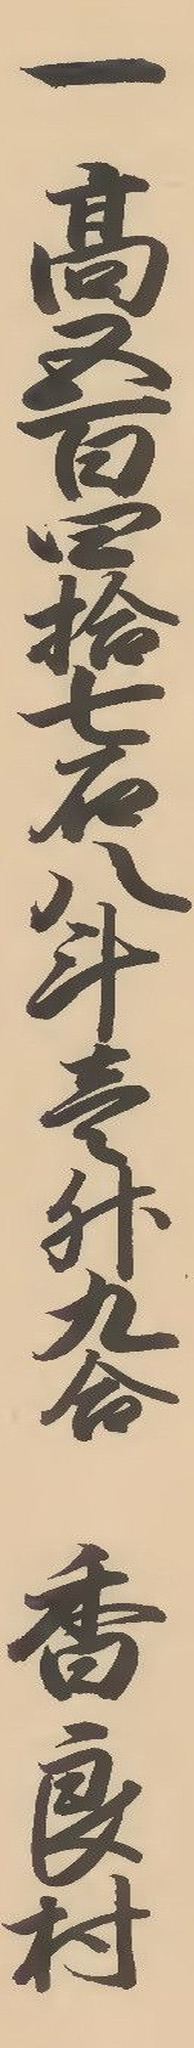一高五百四拾七石八斗壱升九合香良村
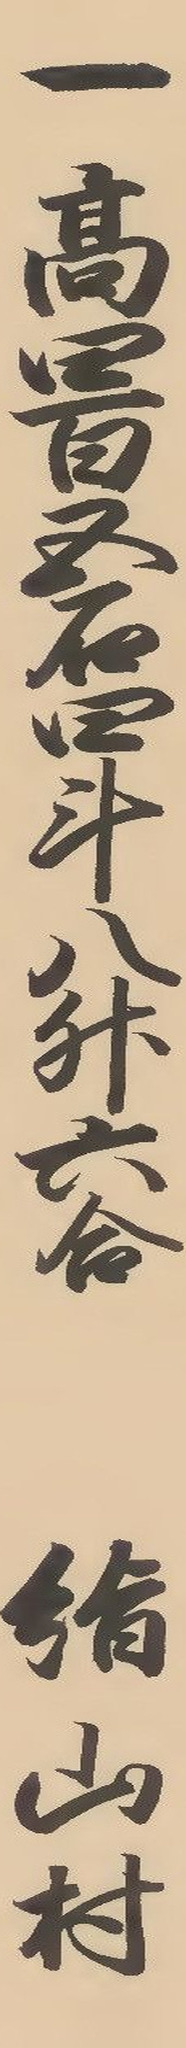一高四百五石四斗八升六合絹山村
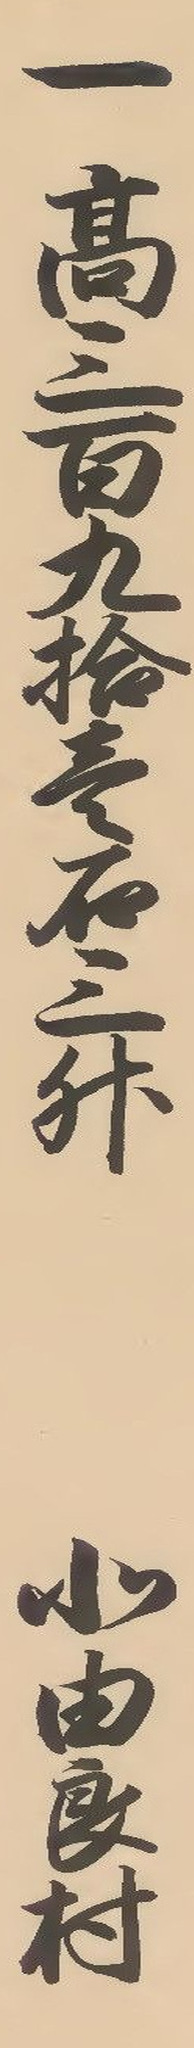一高三百九拾壱石三升北由良村
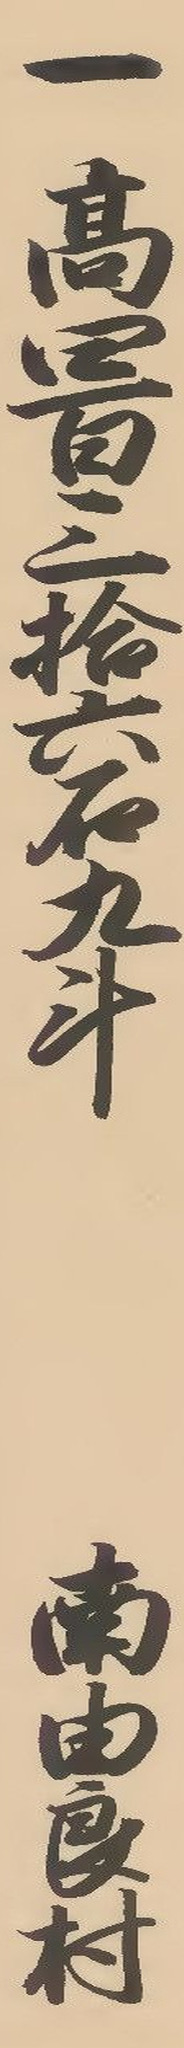一高四百三拾六石九斗南由良村
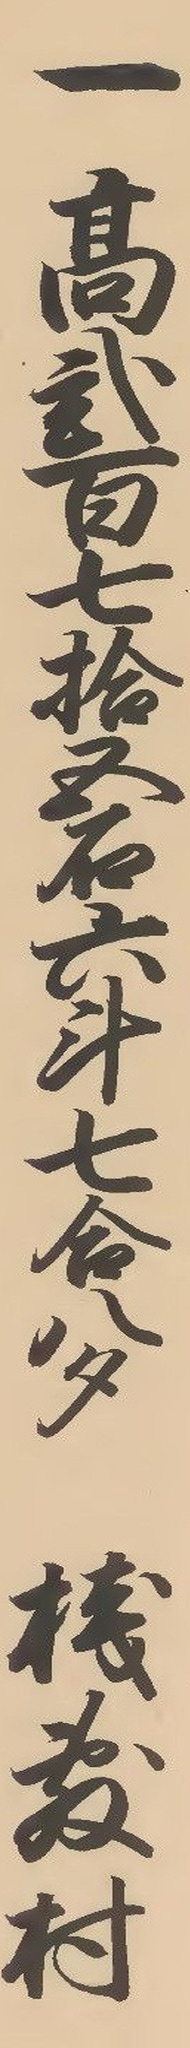一高弐百七拾五石六斗七合八勺桟敷村
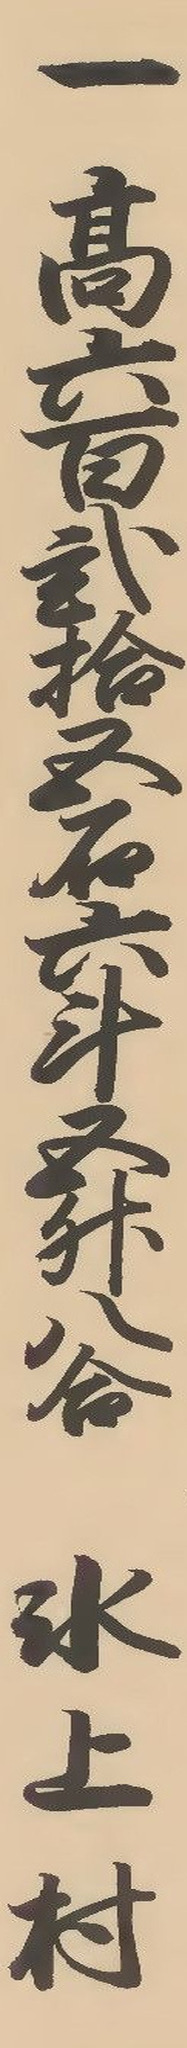一高六百弐拾五石六斗五升八合氷上村
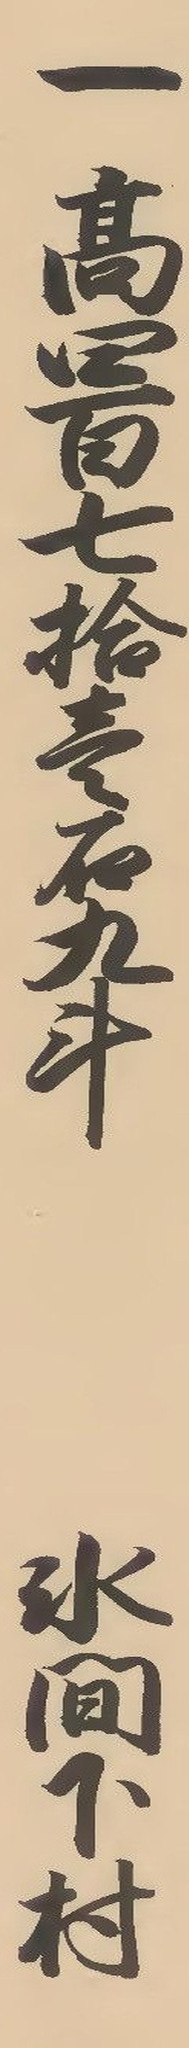一高四百七拾壱石九斗氷間下村
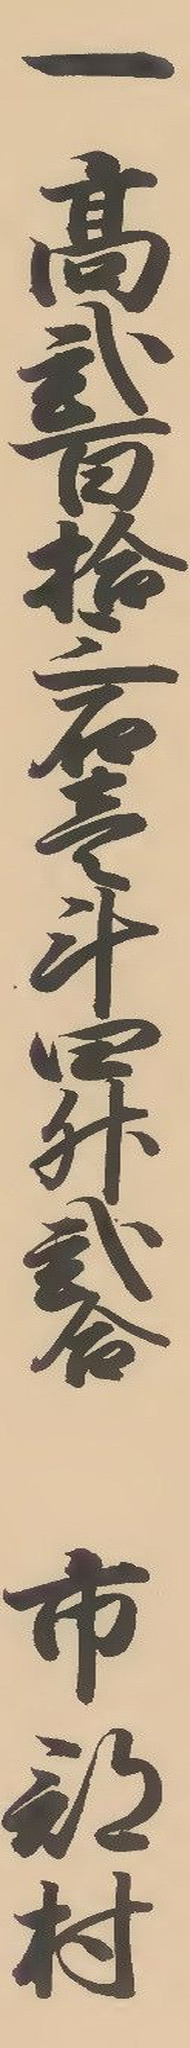一高弐百拾三石壱斗四升弐合市部村

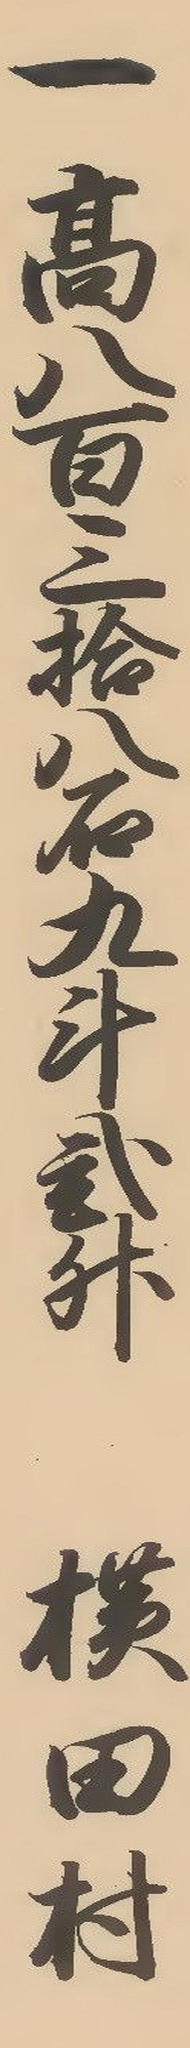一高八百三拾八石九斗弐升横田村
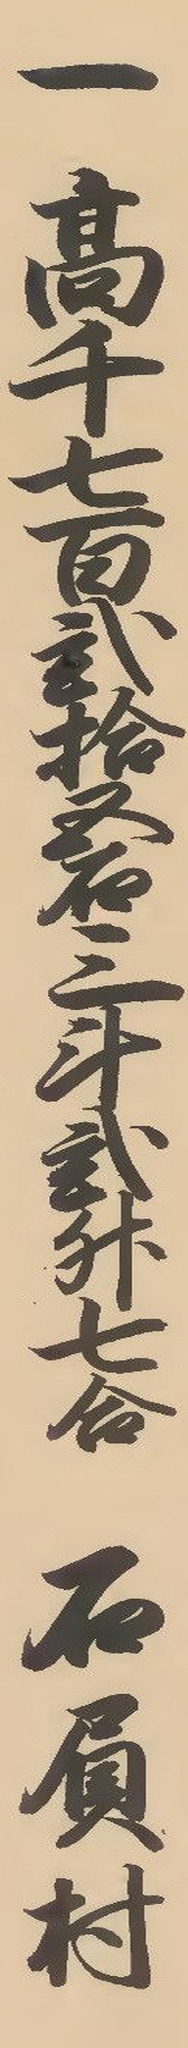一高千七百弐拾五石三斗弐升七合石負村
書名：丹波国郷帳
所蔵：国立公文書館 National Archives of Japan
